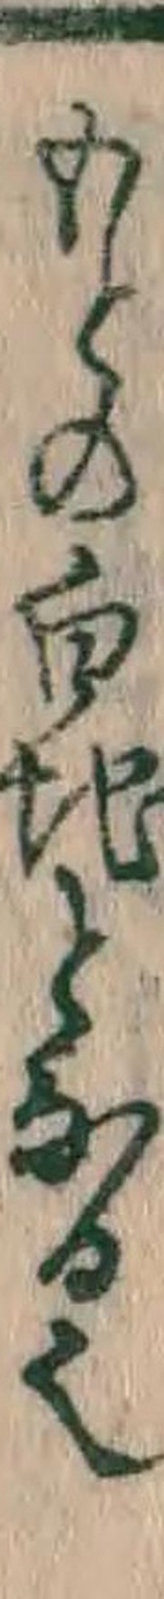もとの白地となる也
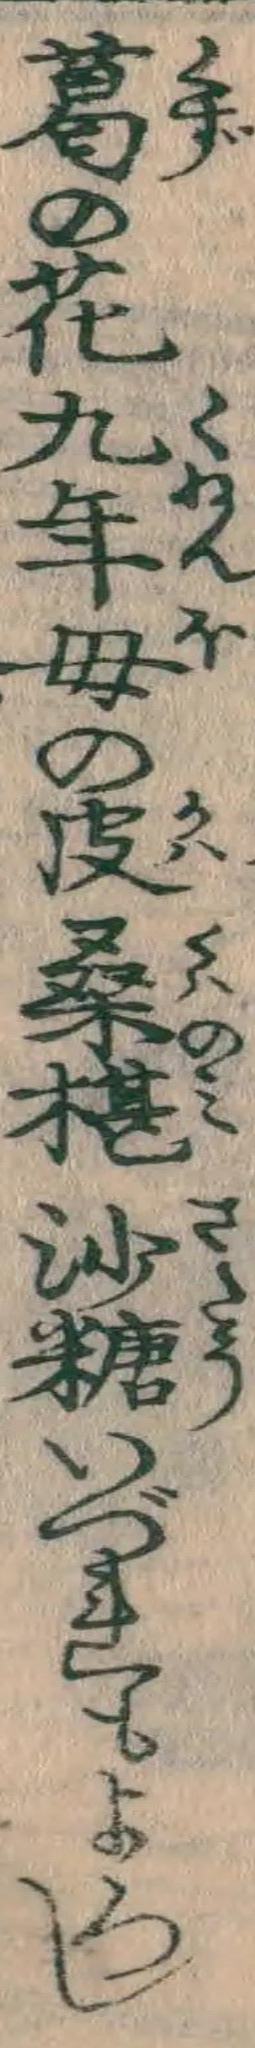葛の花九年母の皮桑椹沙糖いづれもよろし
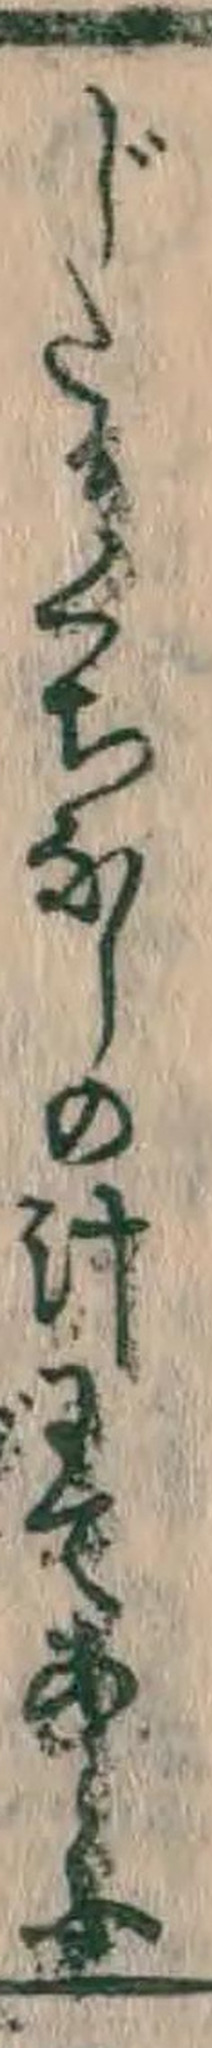じたるくちなしの汁にてあらふ
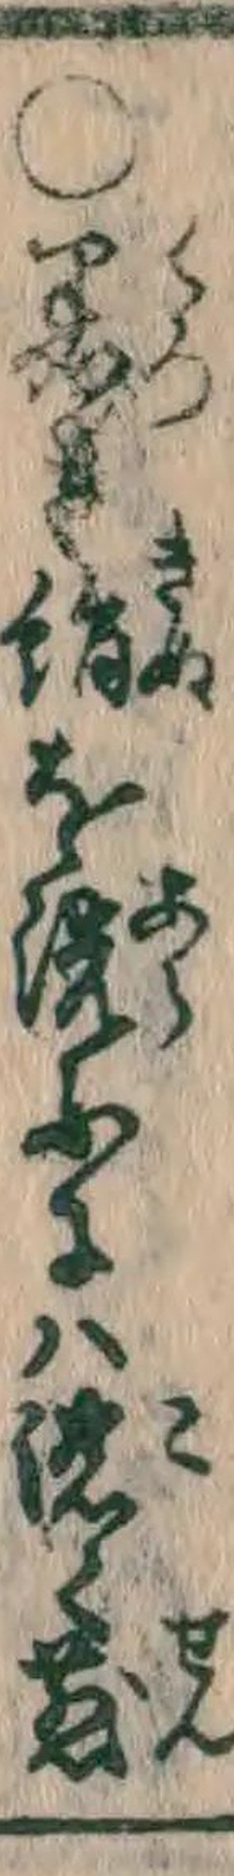○黒き絹を洗ふには濃く煎
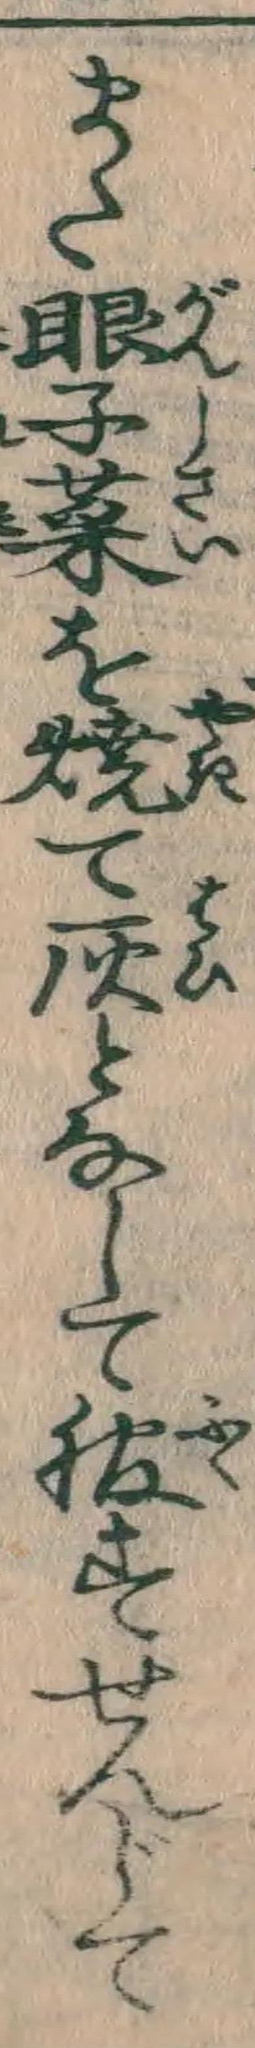また眼子菜を焼て灰となして服すせんじて
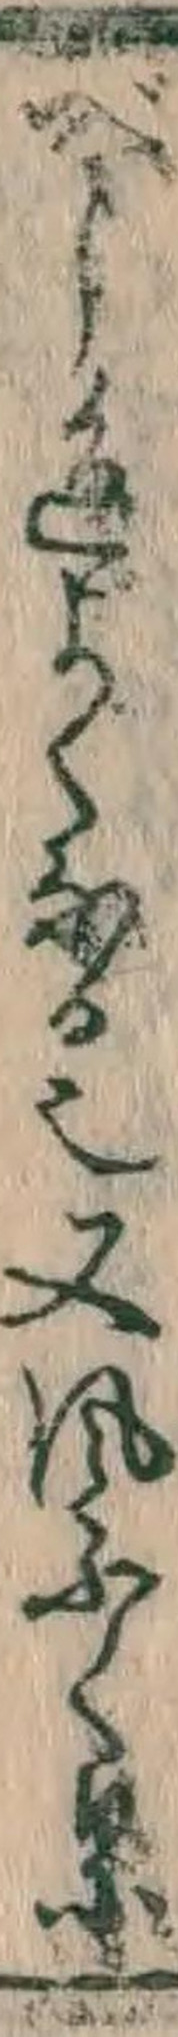べし色よくなる也又風ふく日に
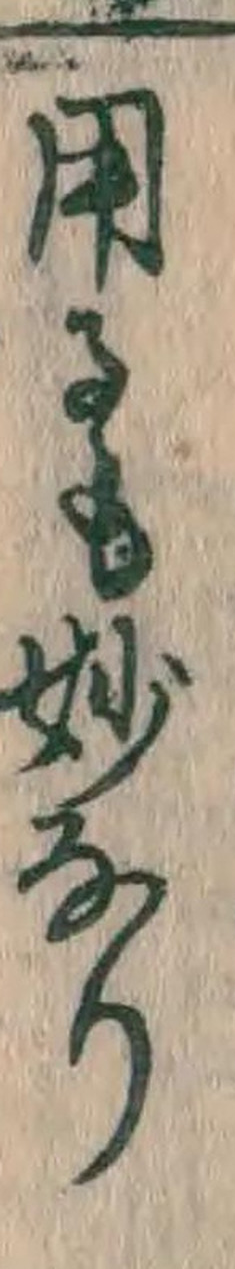用るも妙なり
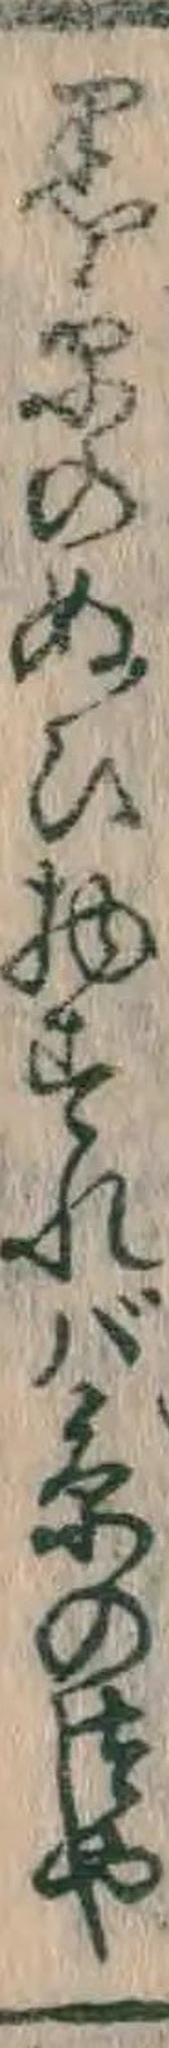黒糸のぬひ物すれば糸のつや
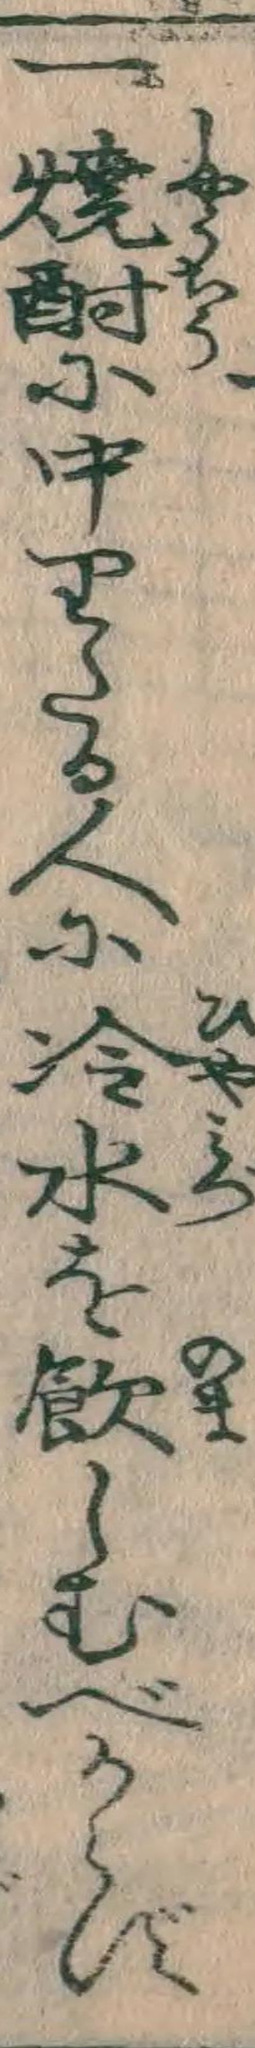一焼酎に中りたる人に冷水を飲しむべからず
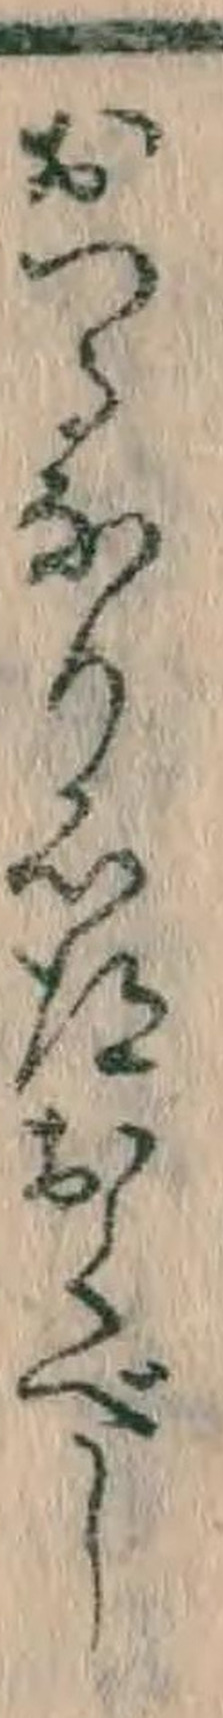おつるなり心得おくべし
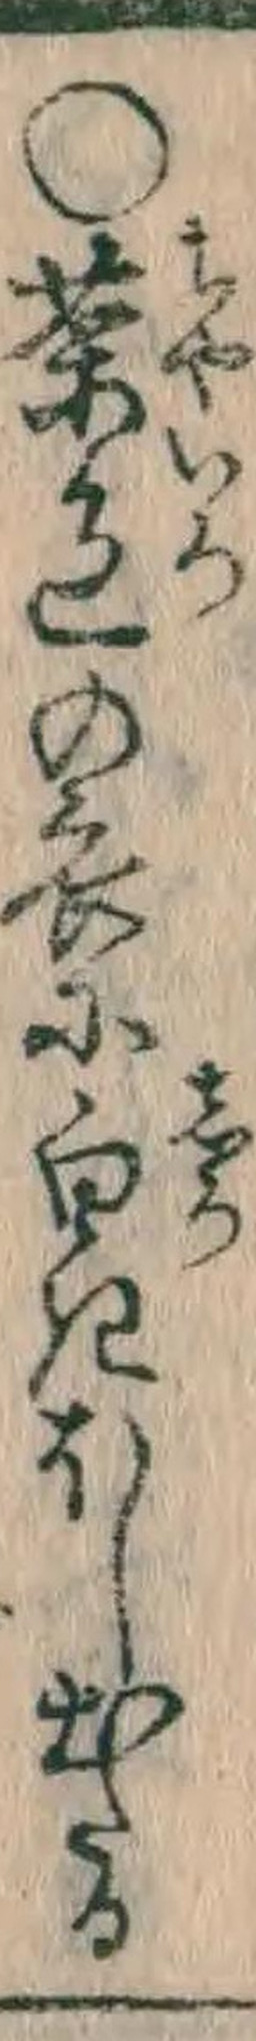○茶色の衣に白きほし出たる
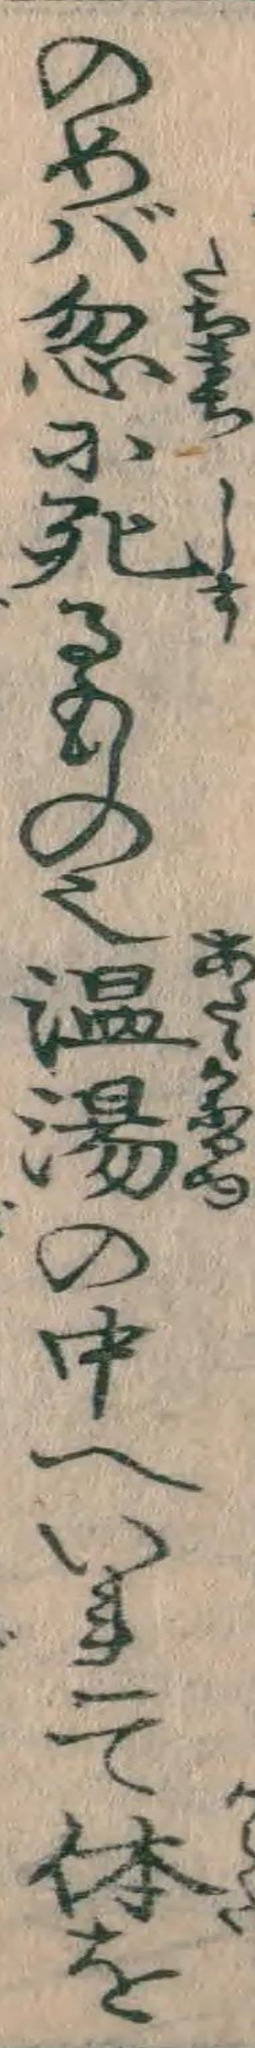のめば忽に死るもの也温湯の中へいれて体を
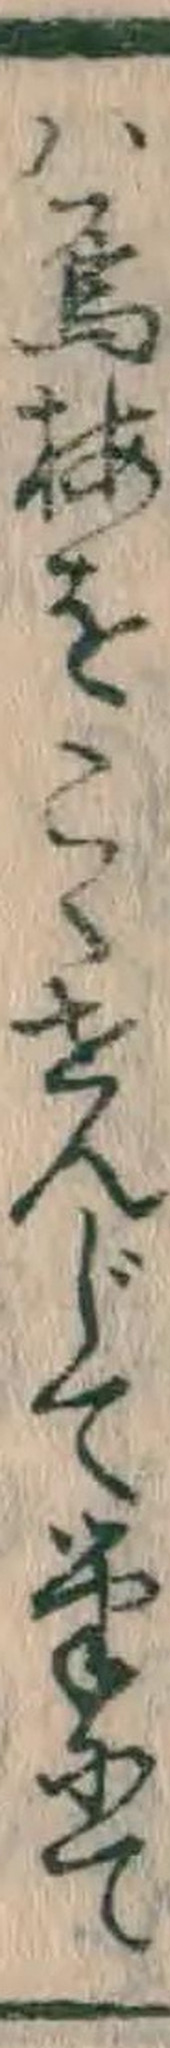は烏梅をこくせんじて筆にて
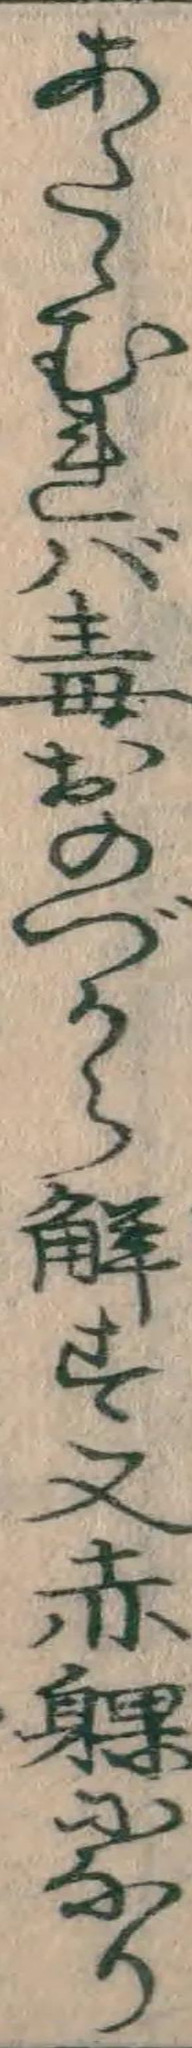あたゝむれば毒おのづから解す又赤躶になり
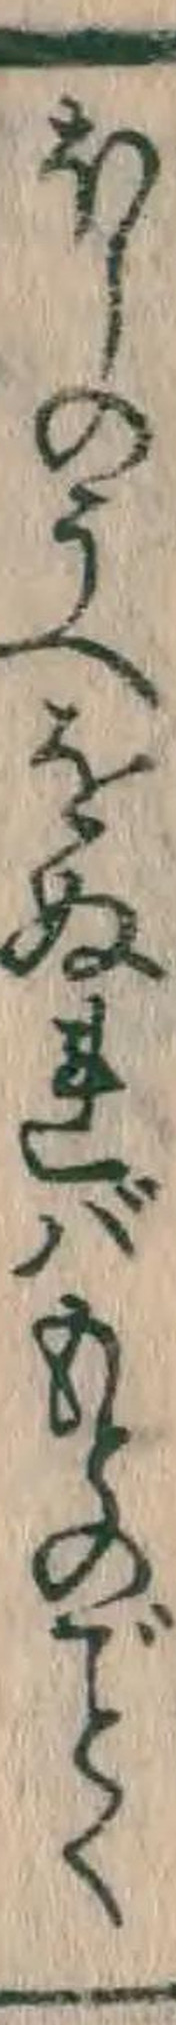ほしのうへをぬればもとのごとく
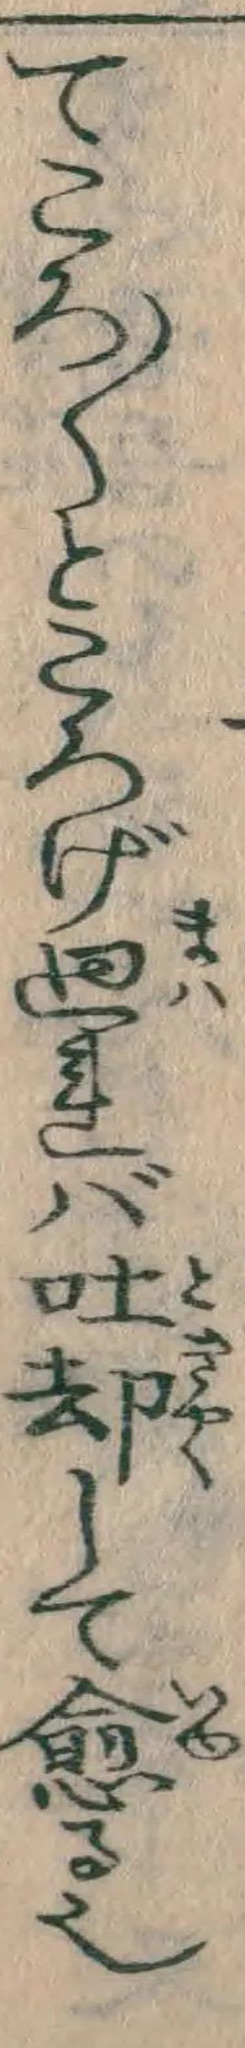てころ〳〵ところげ廻れば吐却して愈る也
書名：広益秘事大全 3巻. [3]
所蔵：国立国会図書館 National Diet Library, JAPAN
